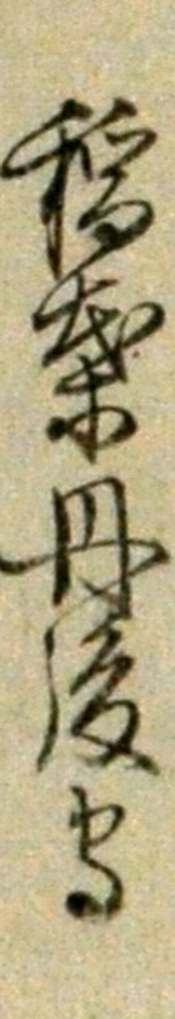稲葉丹後守
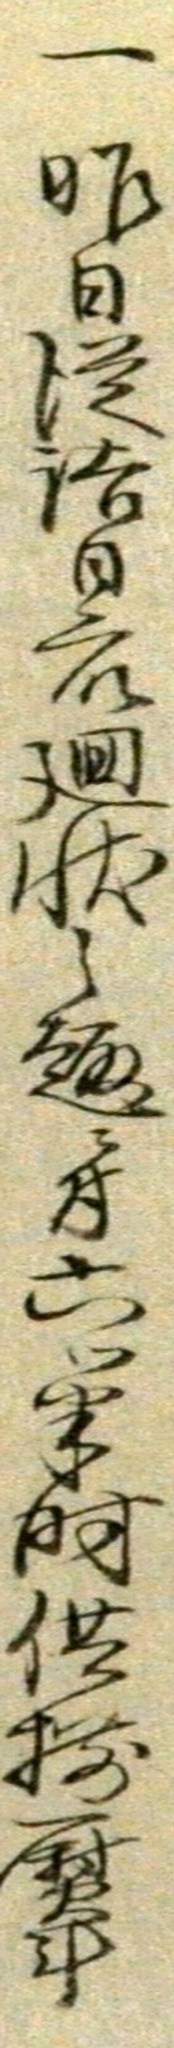一昨日従詰日衆廻状之趣ニ付六ツ半時供揃熨斗
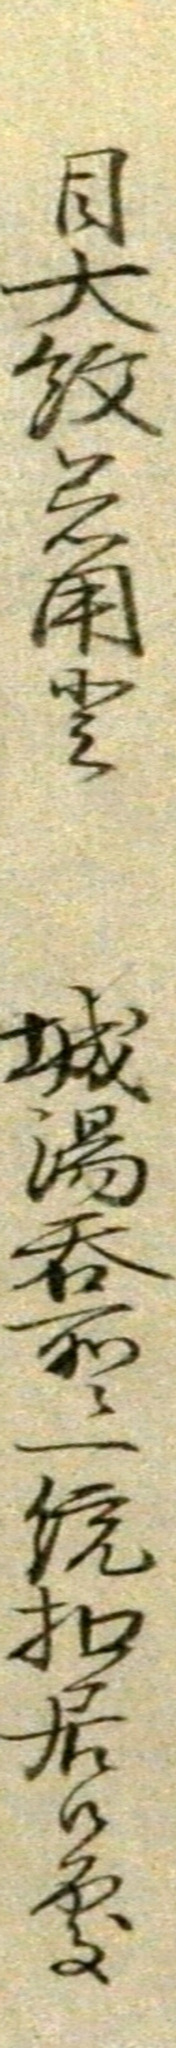目大紋着用登城湯呑処ニ一統扣居候処
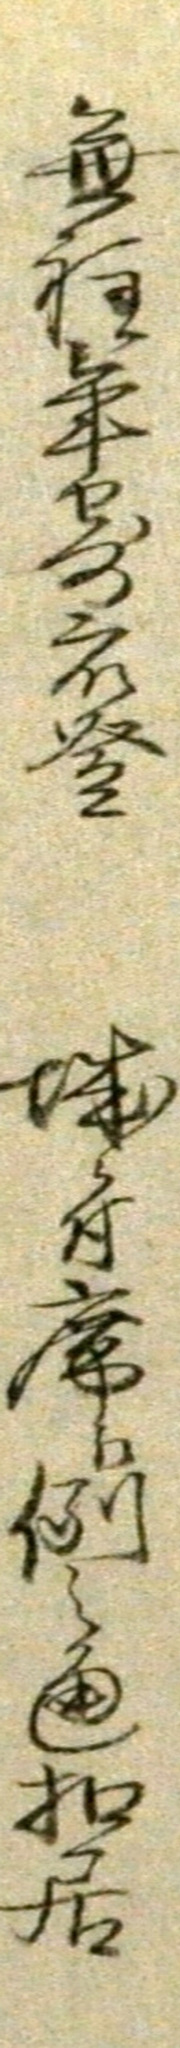無程年寄衆登城ニ付席え例之通扣居
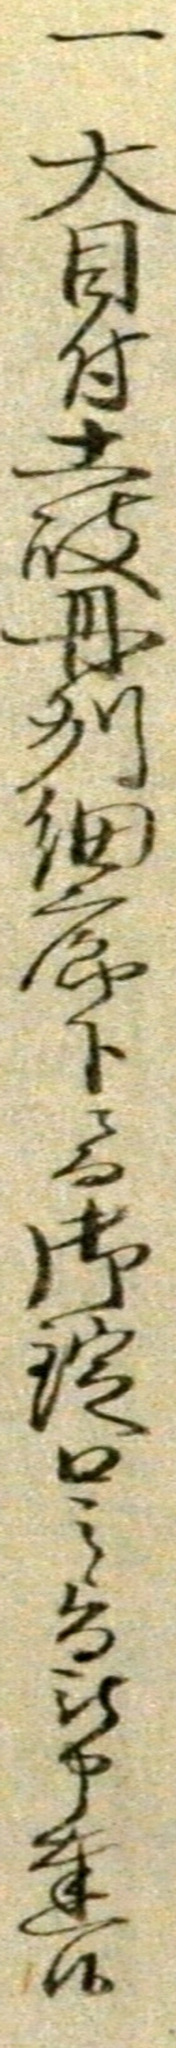一大目付土岐丹州細廊下ニ而御錠口之旨被申達候
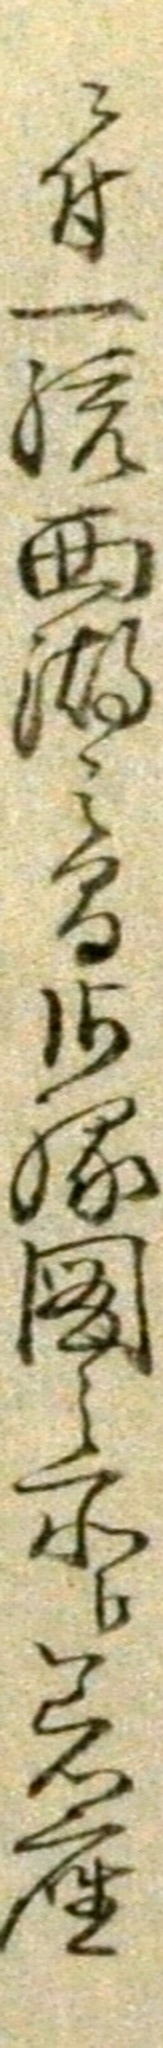ニ付一統西湖之間御縁図之所え着座
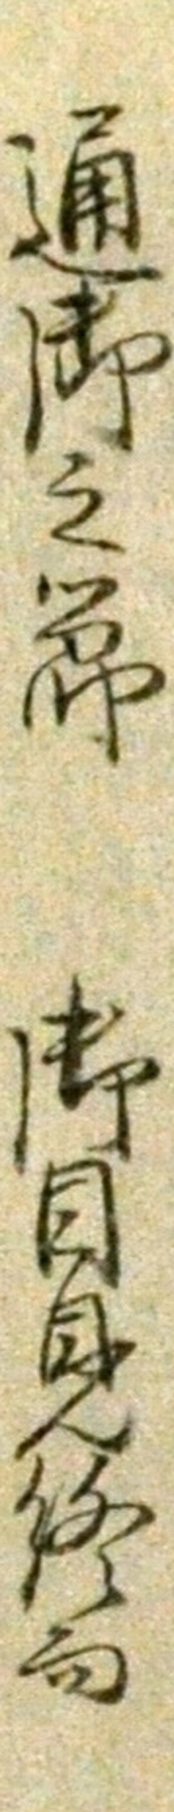通御之節御目見終而
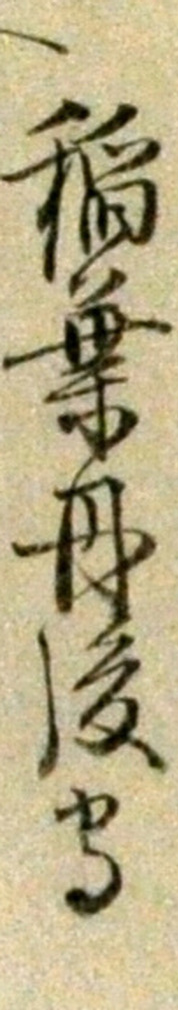稲葉丹後守
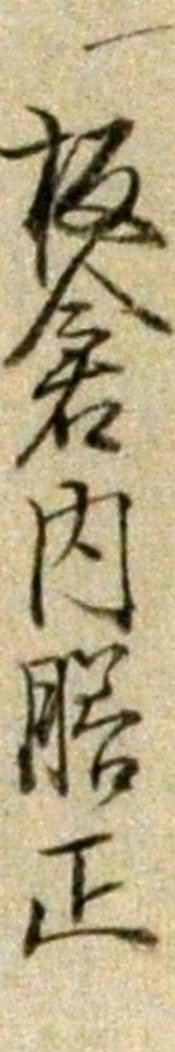板倉内膳正
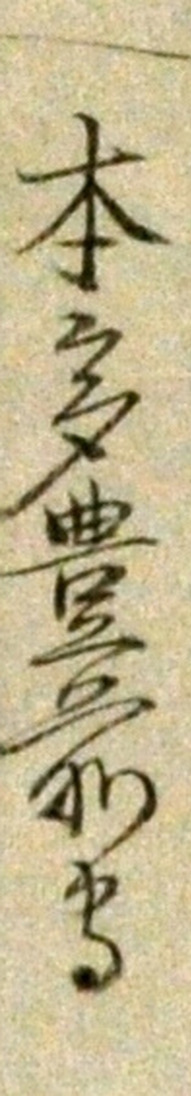無之本多豊前守
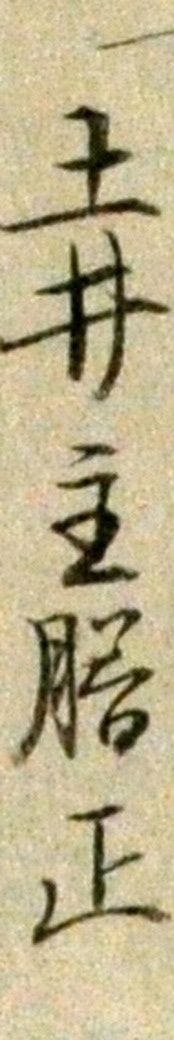土井主膳正
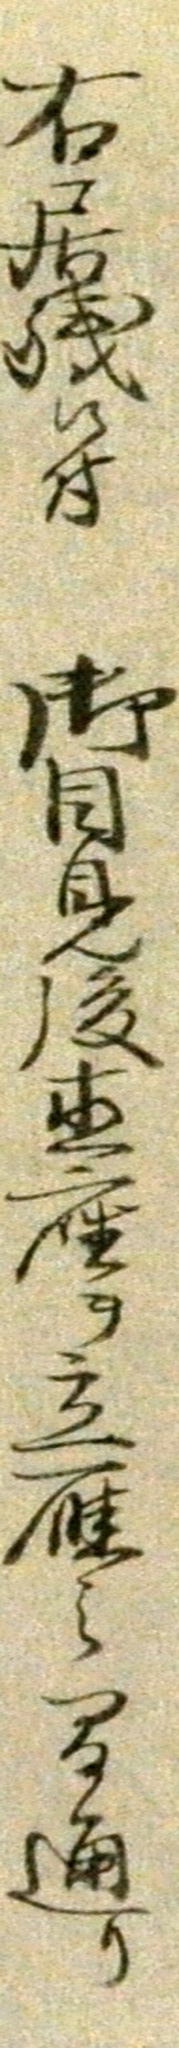右居残候付御目見後直座ヲ立雁之間通り
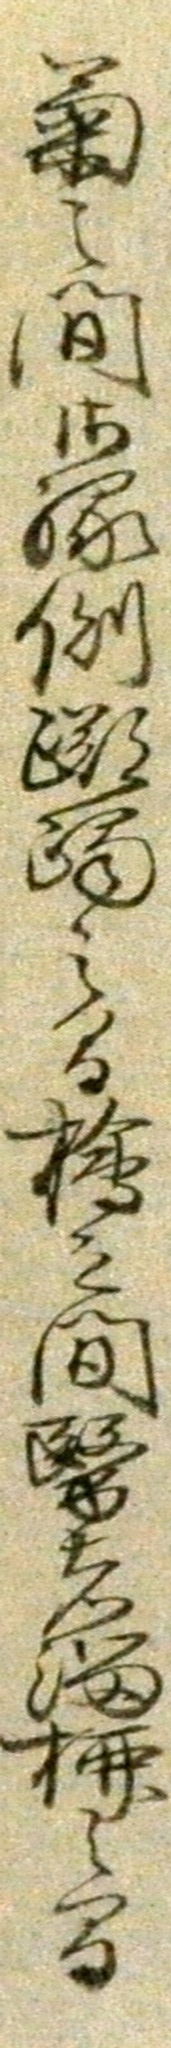菊之間御縁側躑躅之間桧之間医者溜柳之間
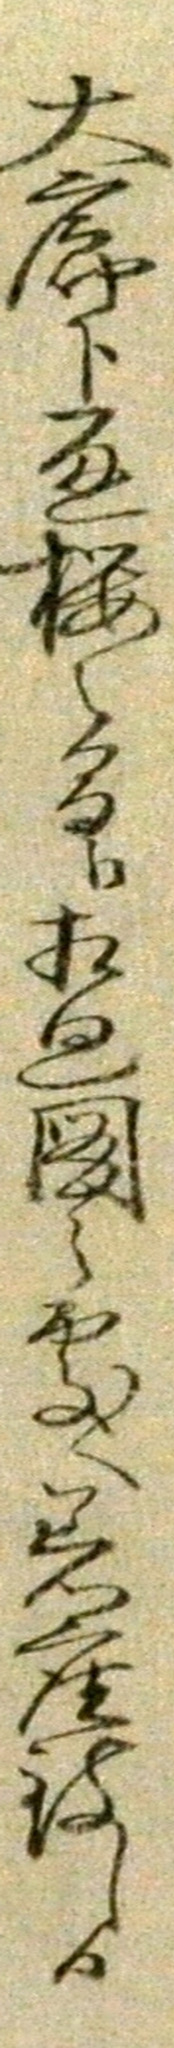大廊下通桜之間え相廻図之処ヘ着座致し候
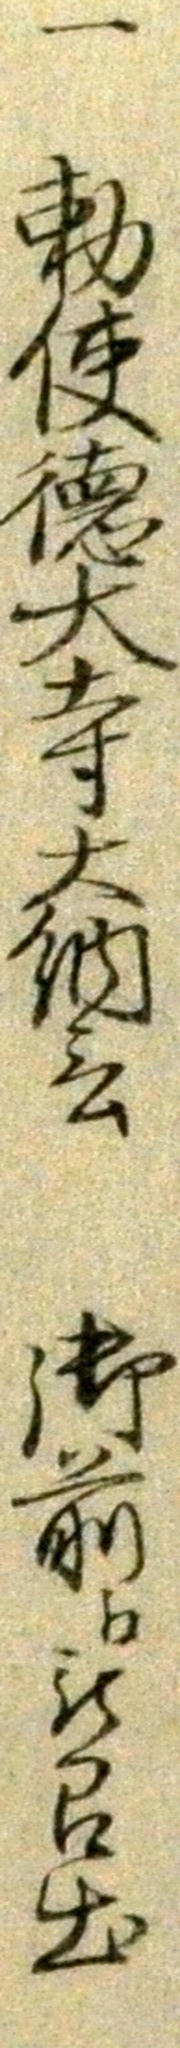一勅使徳大寺大納言御前え被召出
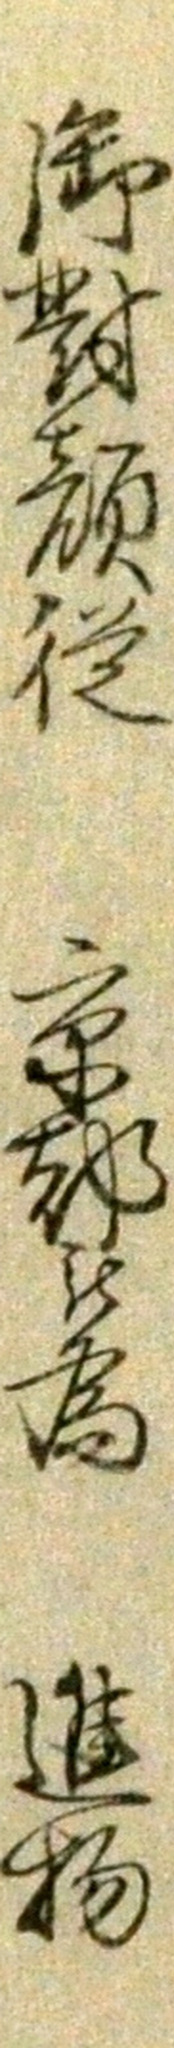御対顔従京都被為進物
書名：諸留書〔一括〕
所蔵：伊那市立高遠町図書館・合同会社AMANE
